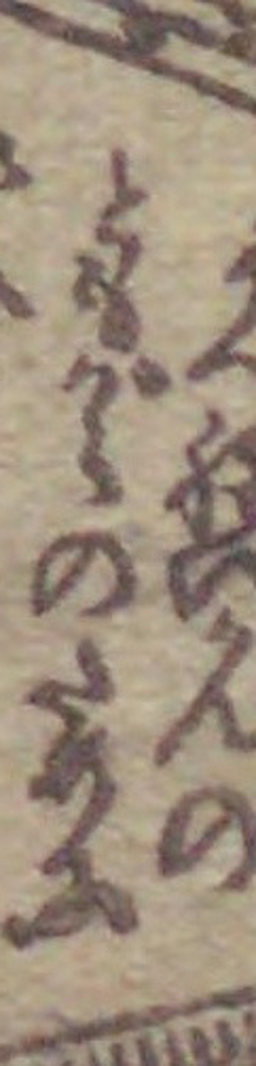ともがらのために
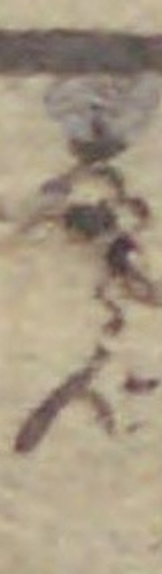ならん
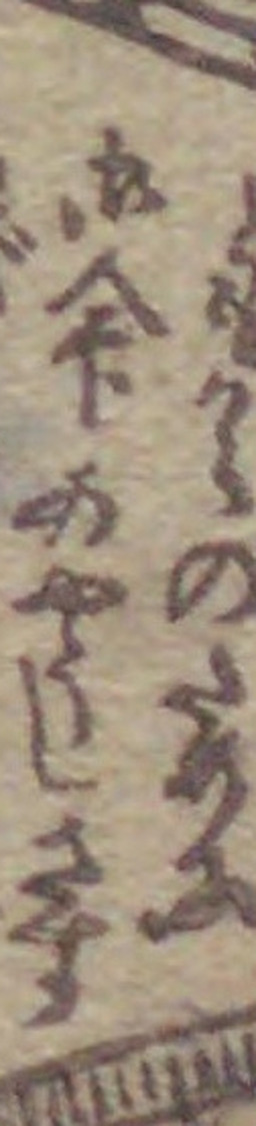御命あやうしさす
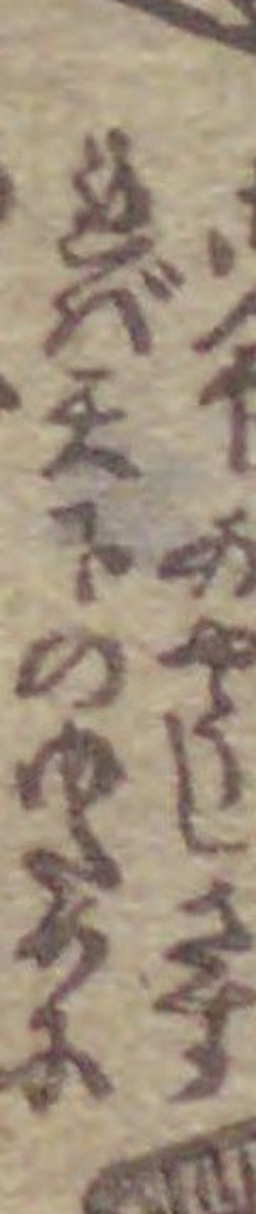れば天下の御ために
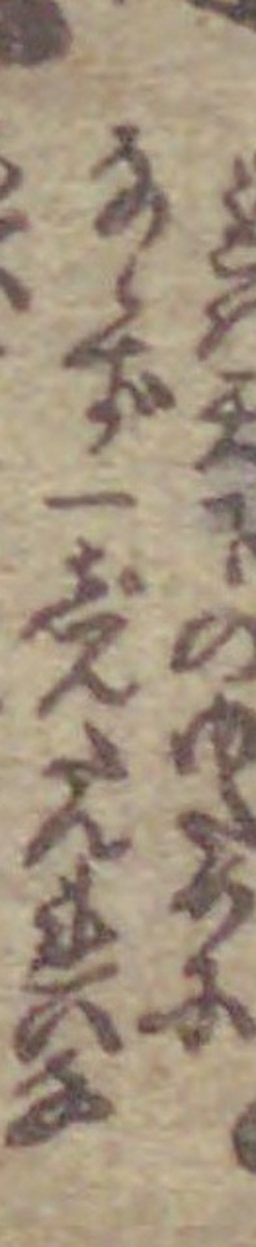ならず一じんたんれいな
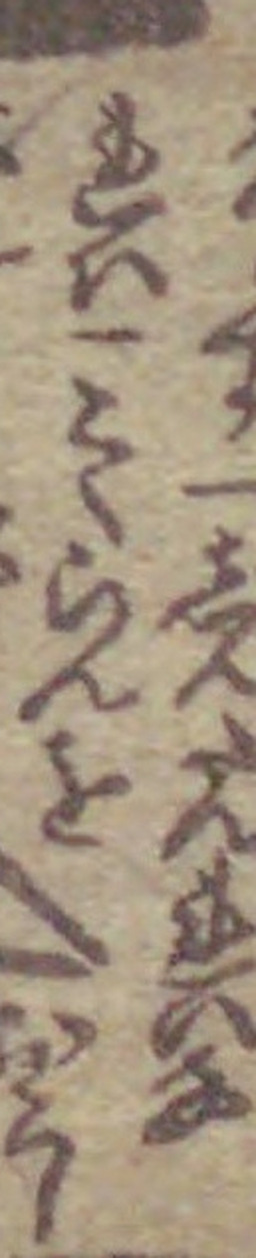れは一こくらんをおこし
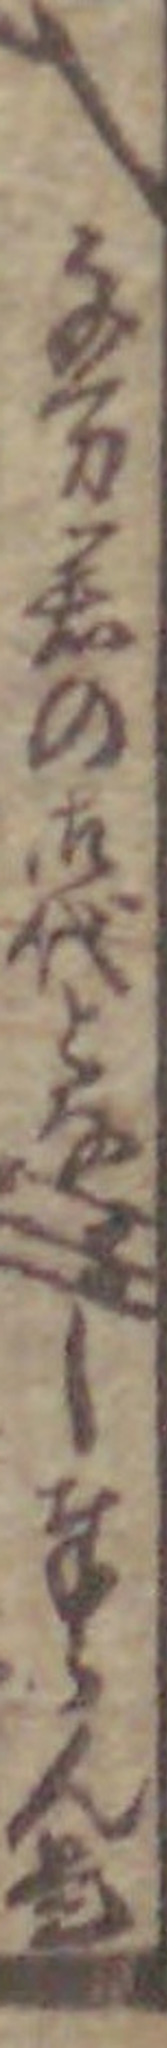千万君の御代となし奉らん是
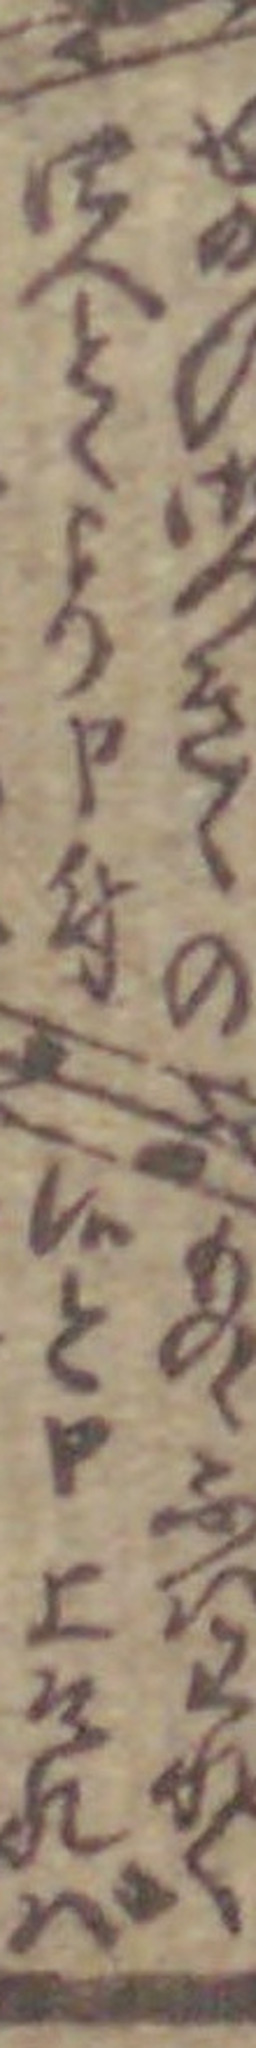四人とくより申付候と申上ければ
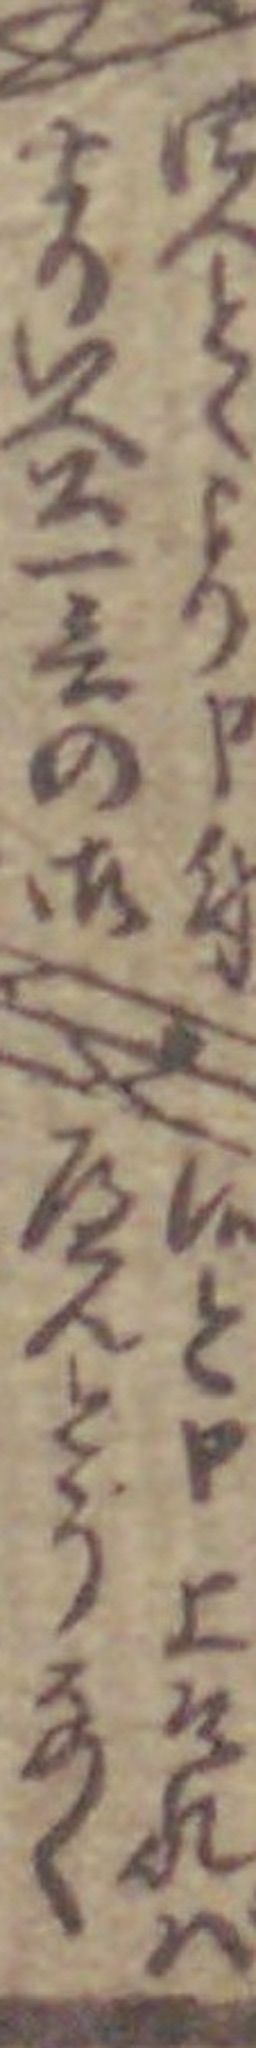よりいへ公一言の御へんとうなく
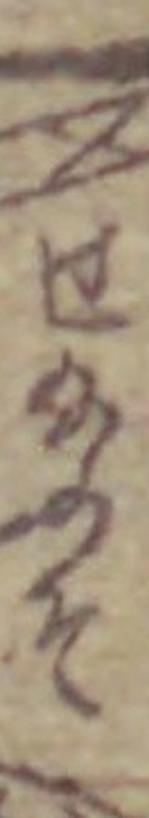せ給ふそ
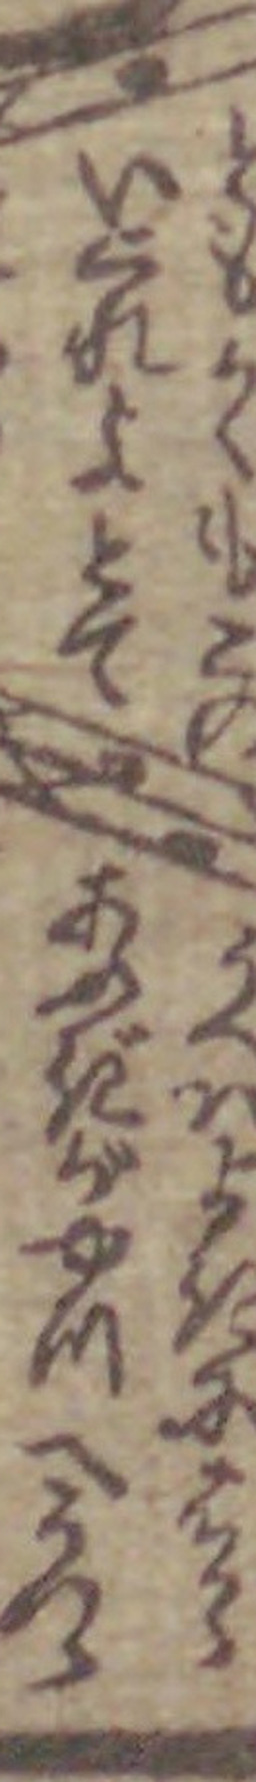いられよとてあふぎがやつへうつら
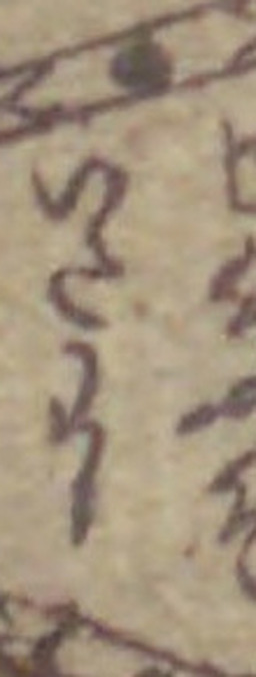いたわし

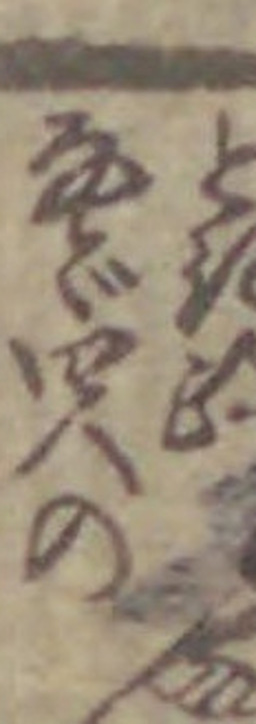など四人の
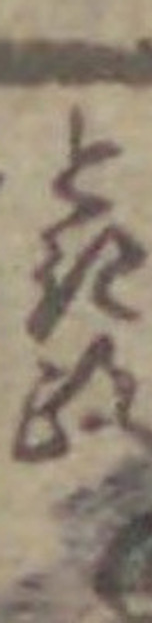とき政
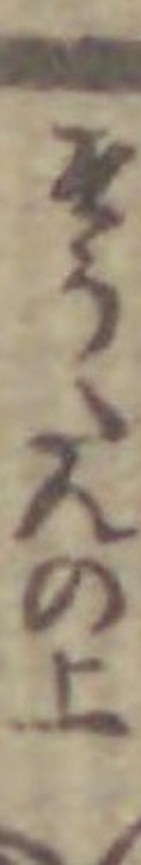そうたんの上
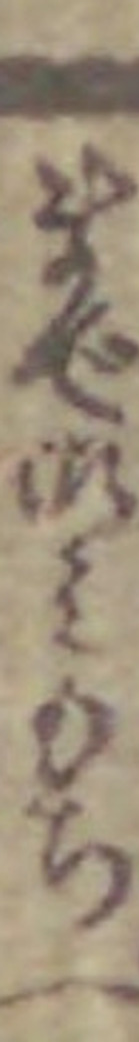まで御みもち
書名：鎌倉山紅葉浮名
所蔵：国立国会図書館 National Diet Library, JAPAN
